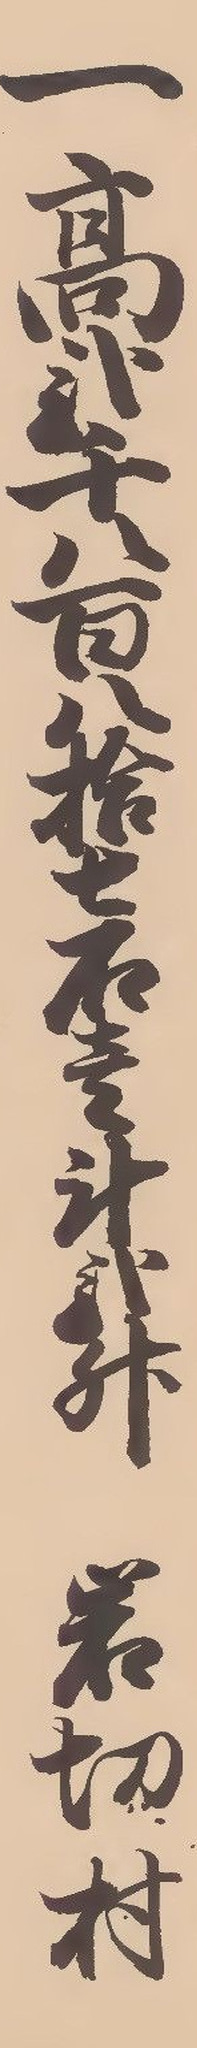一高弐千八百八拾七石壱斗弐升岩切村
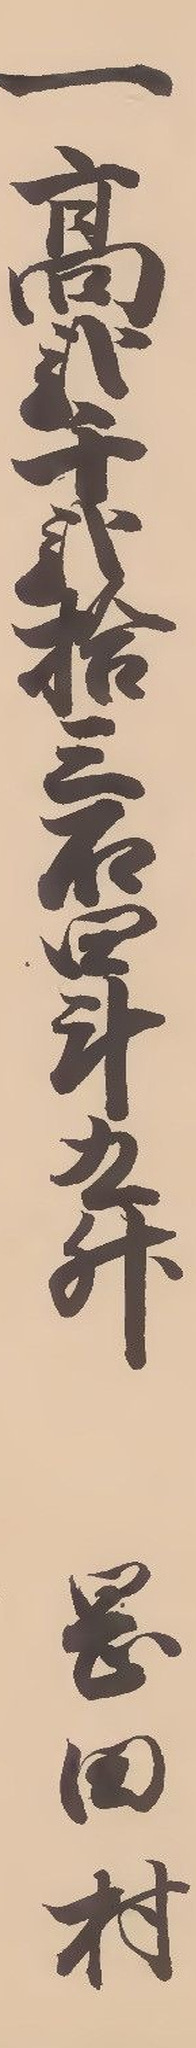一高弐千弐拾三石四斗九升岡田村
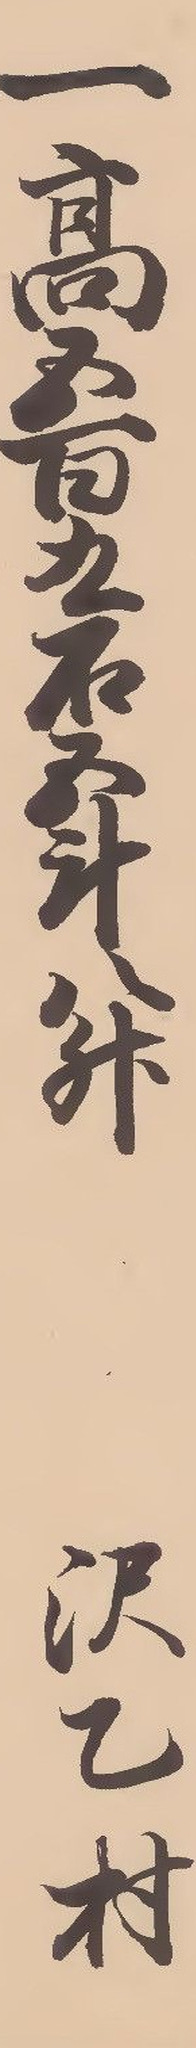一高五百九石五斗八升沢乙村
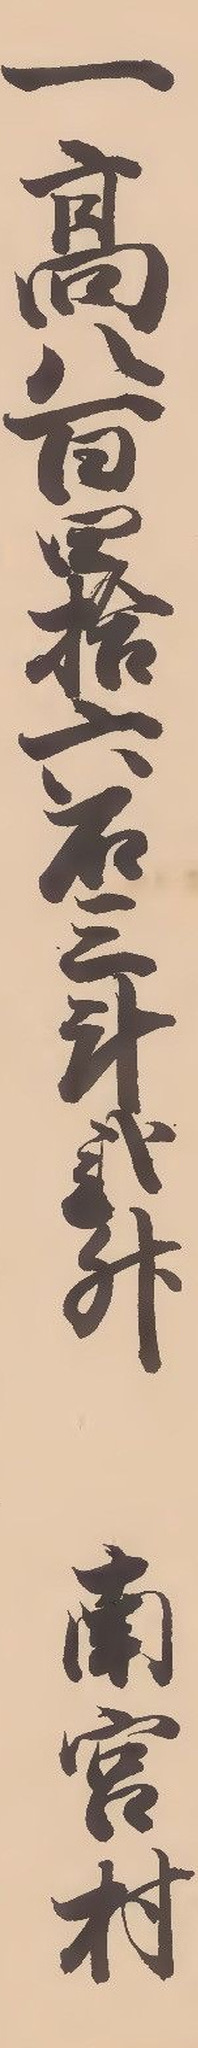一高八百四拾六石三斗弐升南宮村
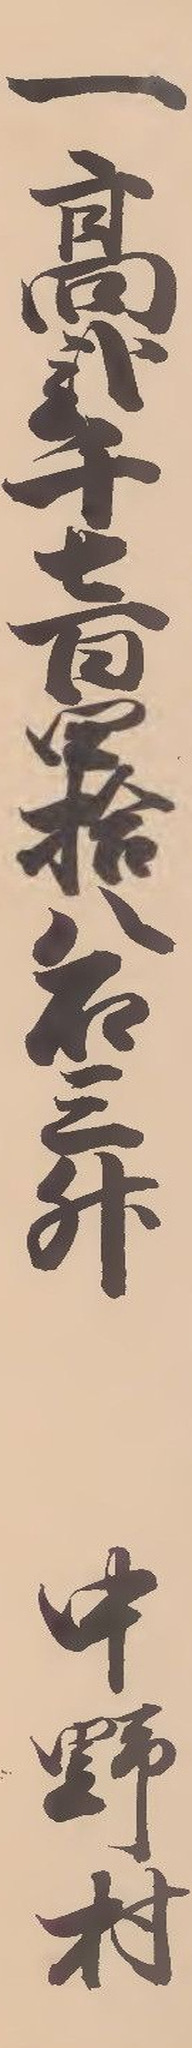一高弐千七百四拾八石三升中野村
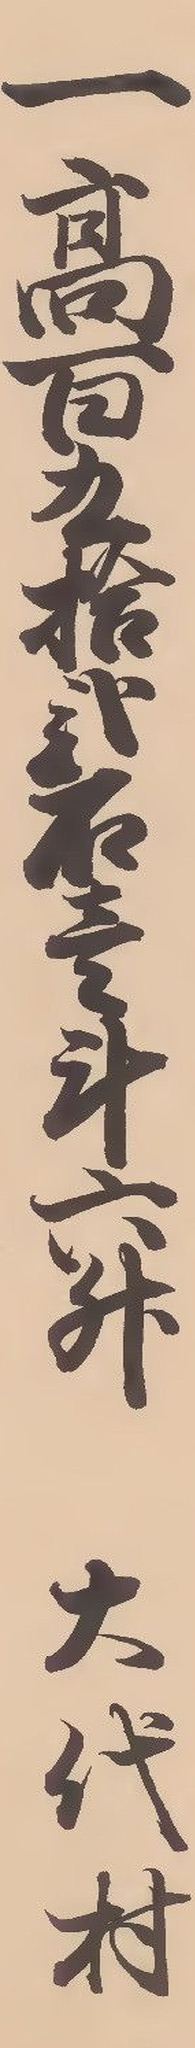一高百九拾弐石壱斗六升大代村
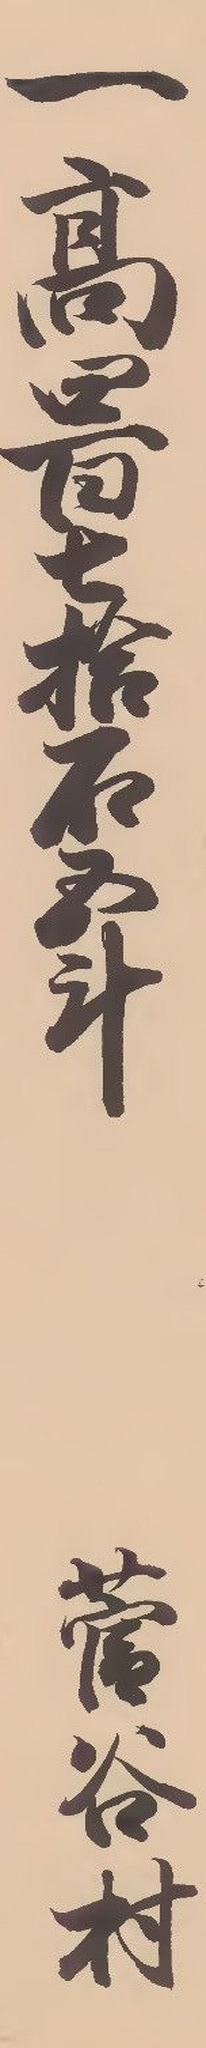一高四百七拾石五斗菅谷村
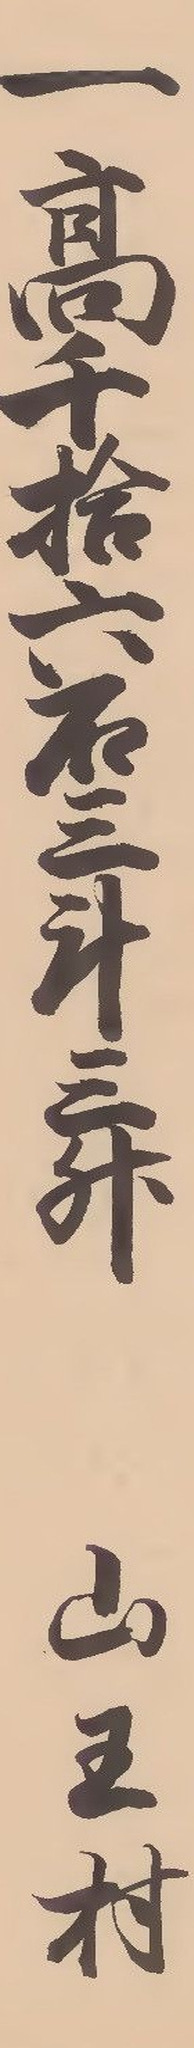一高千拾六石三斗三升山王村

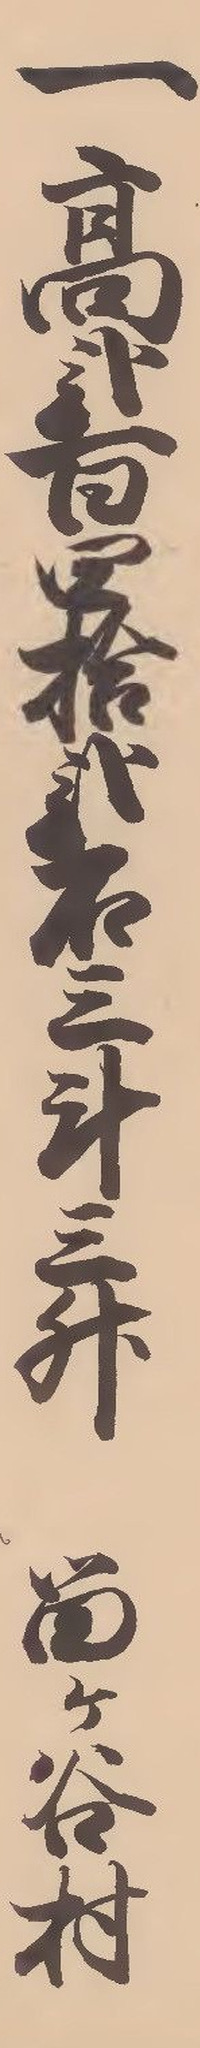一高弐百四拾弐石三斗三升留ヶ谷村
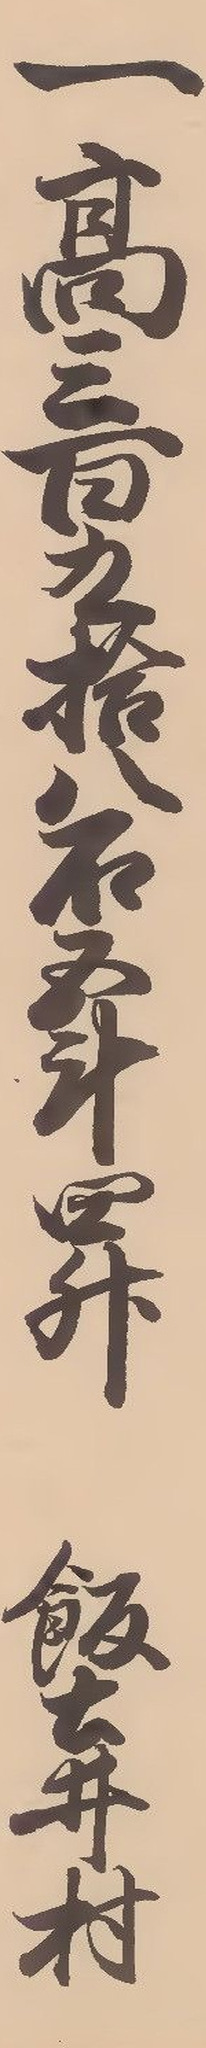一高三百九拾八石五斗四升飯土井村
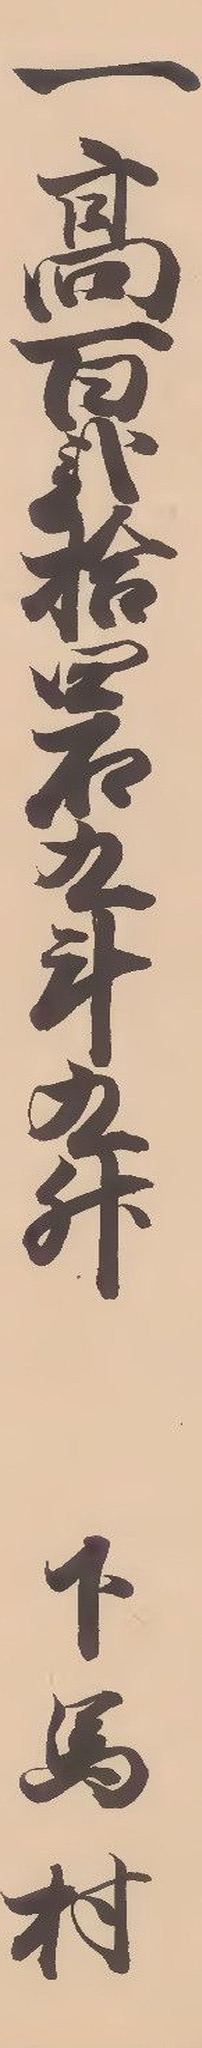一高百弐拾四石九斗九升下馬村
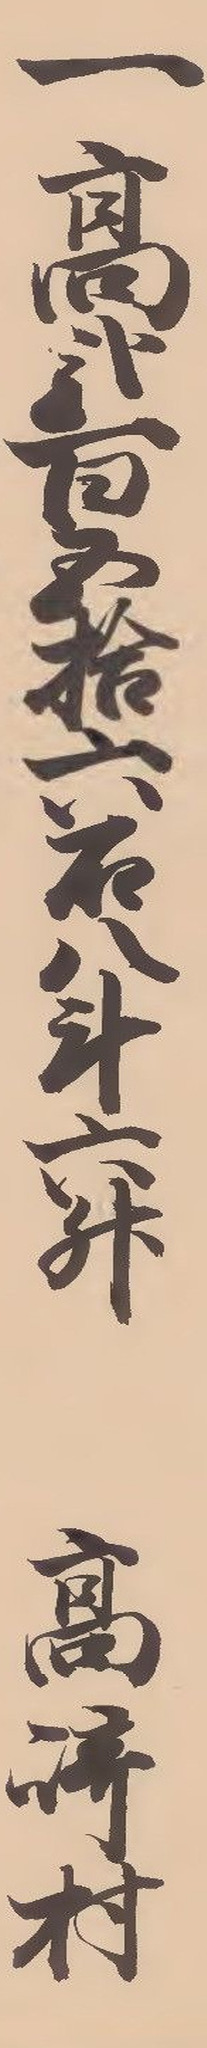一高弐百五拾六石八斗六升高崎村
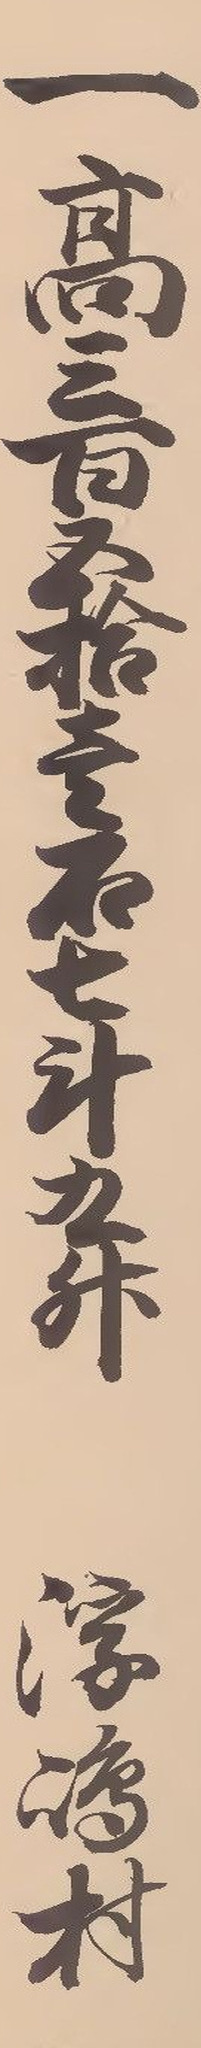一高三百五拾壱石七斗九升浮島村
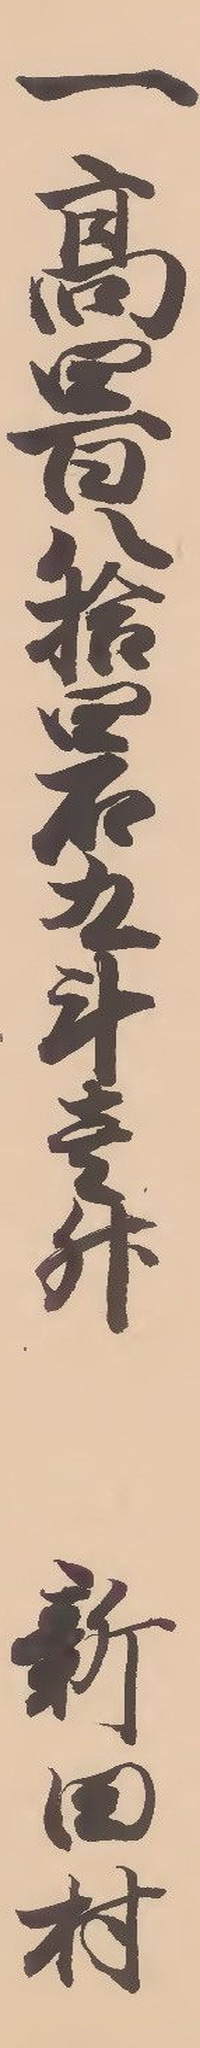一高四百八拾四石九斗壱升新田村
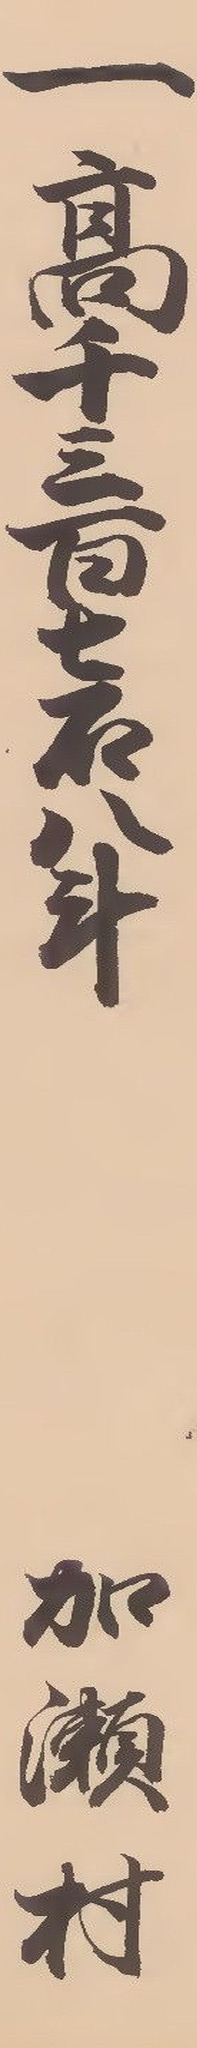一高千三百七石八斗加瀬村
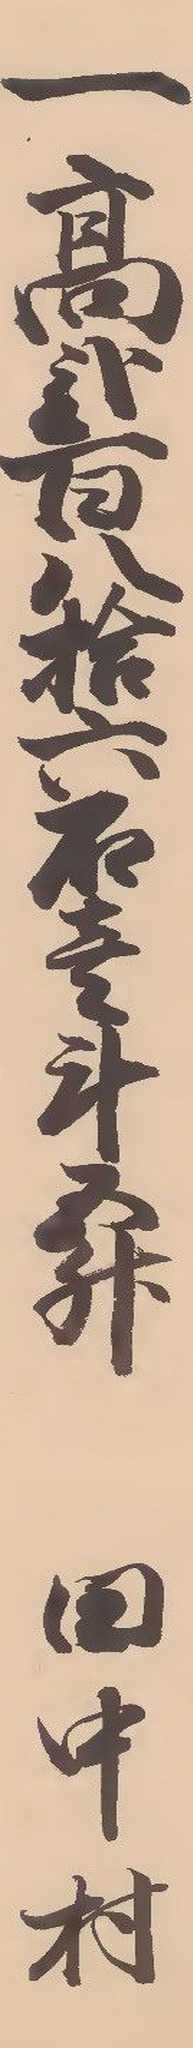一高弐百八拾六石壱斗五升田中村
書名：陸奥国郷帳　５
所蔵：国立公文書館 National Archives of Japan
